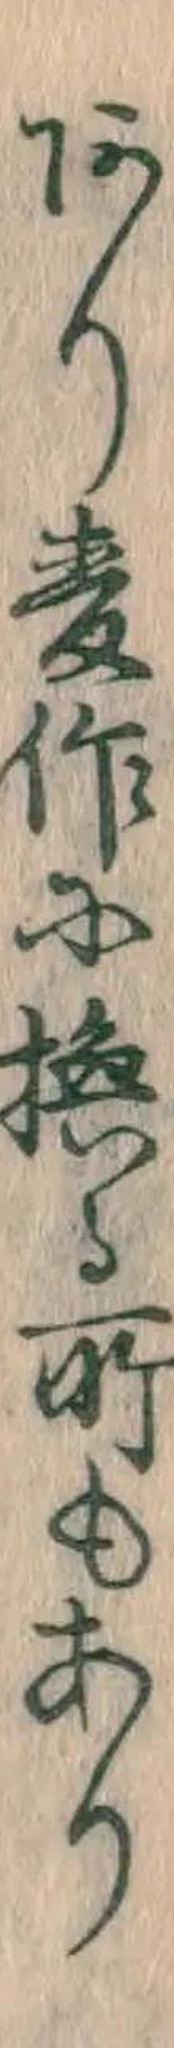あり麦作に換る所もあり
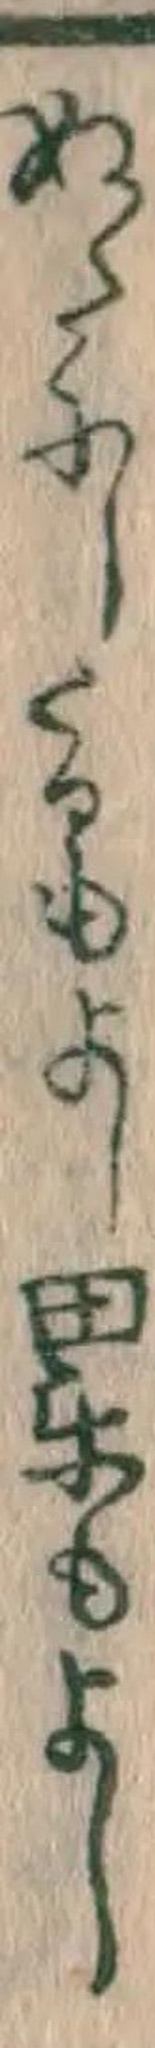ぬたにしたるもよし田楽もよし
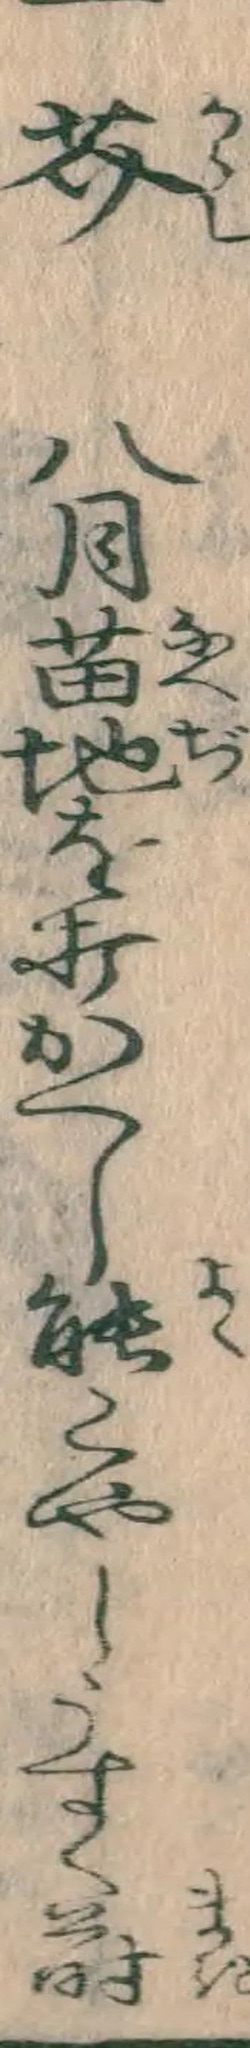一芥八月苗地を打かへし能こやしうすく蒔
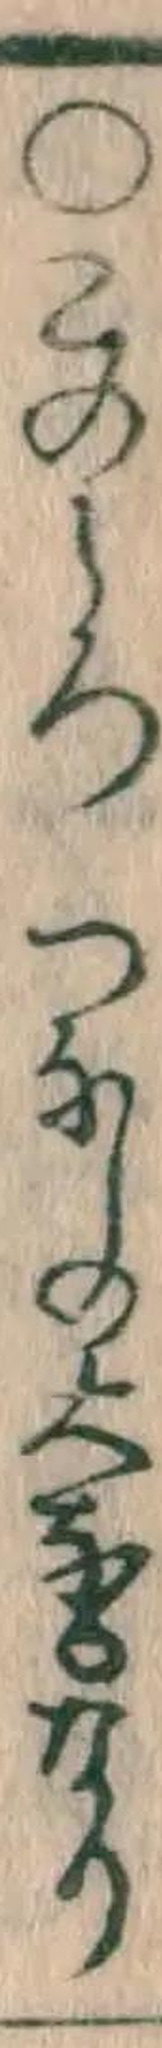○このしろつなしの大なるなり
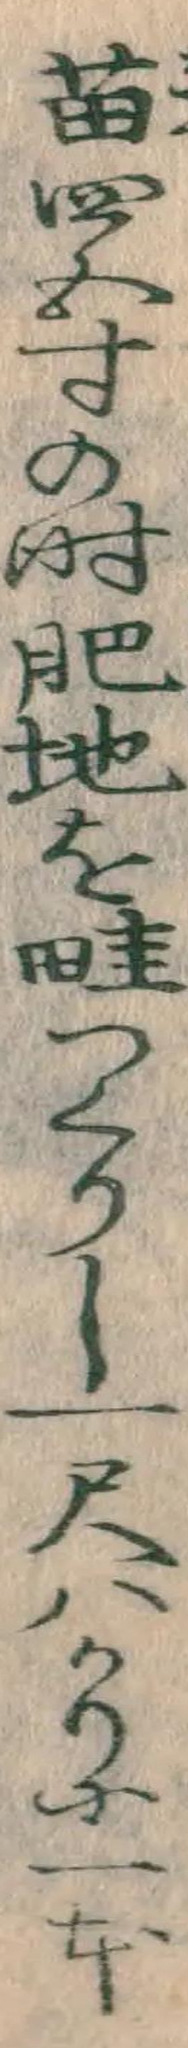苗四五寸の時肥地を畦つくりし一尺はかりに一本
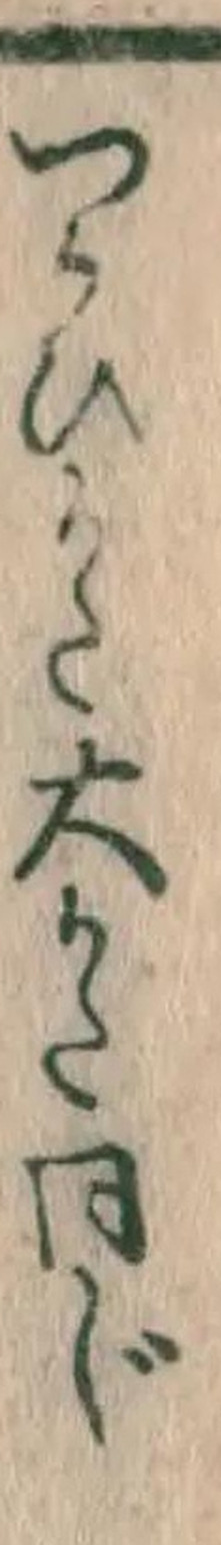つかひかた大かた同じ
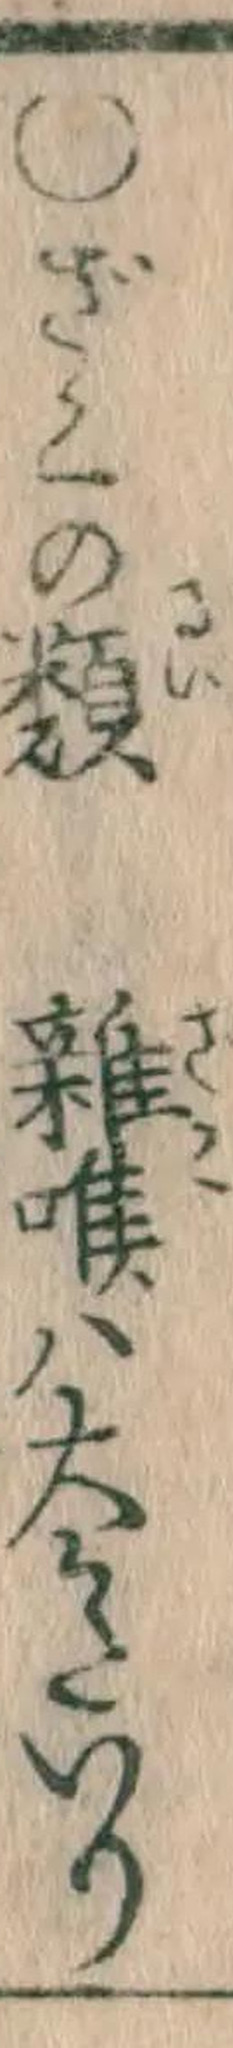○ざこの類雑喉は大かたいり
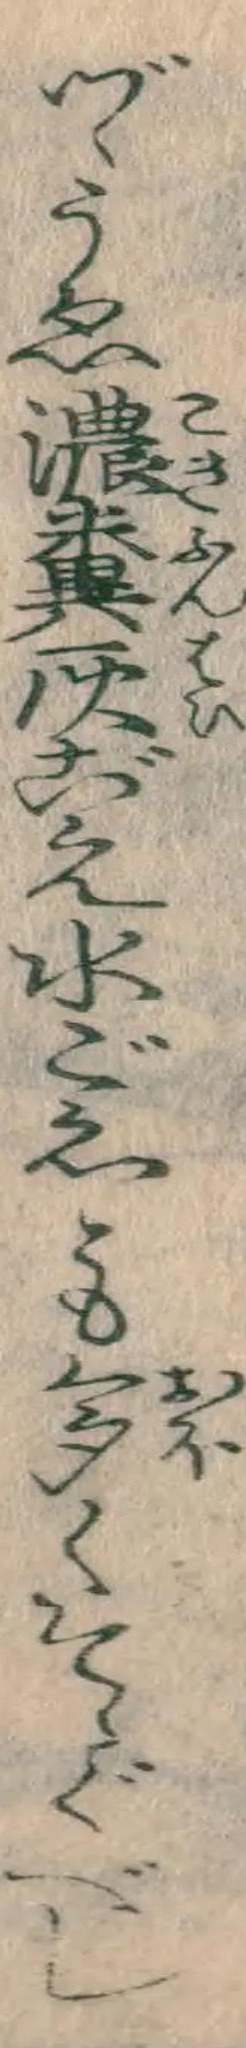づゝうゑ濃糞灰ごえ水ごえとも多くそゝぐべし
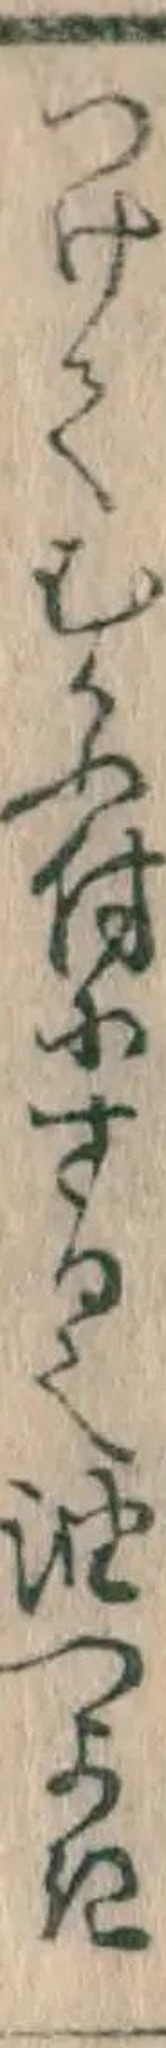つけてむかふ付にする也油つよき
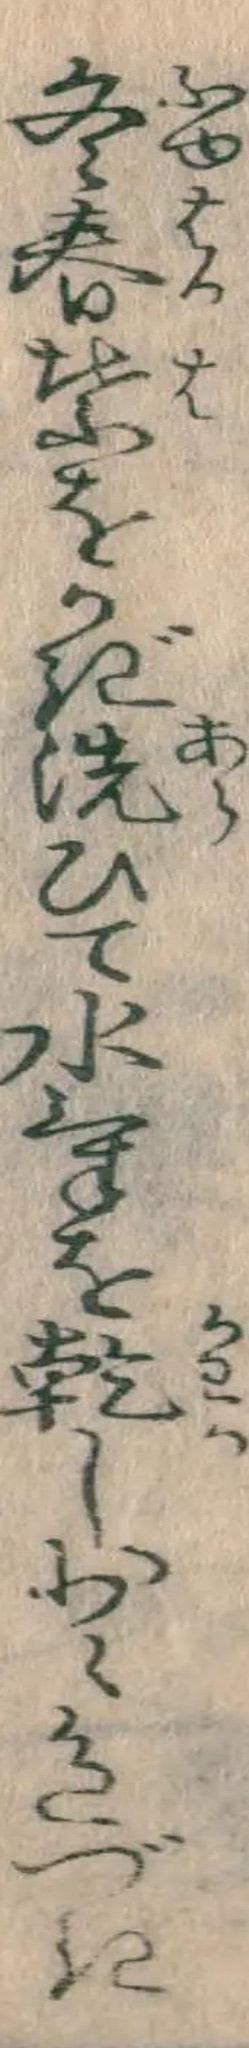冬春葉をかぎ洗ひて水気を乾し少々色づき
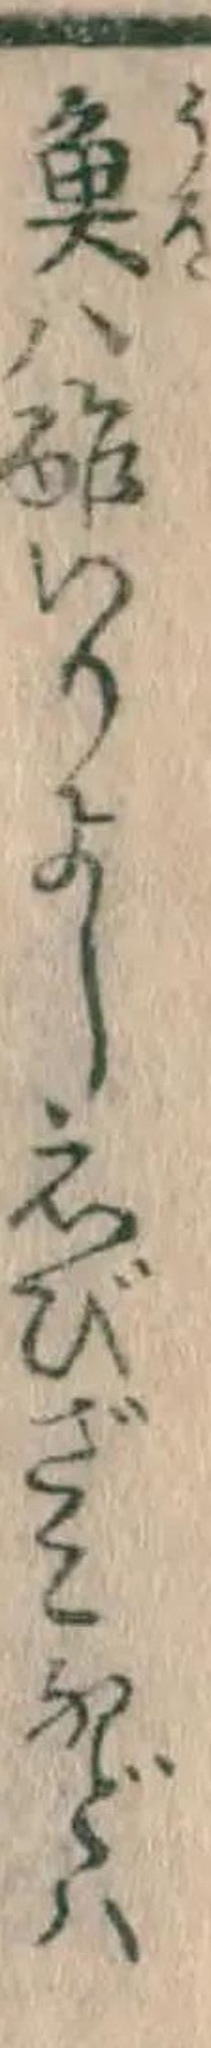魚は酢いりよしえびざこなどは
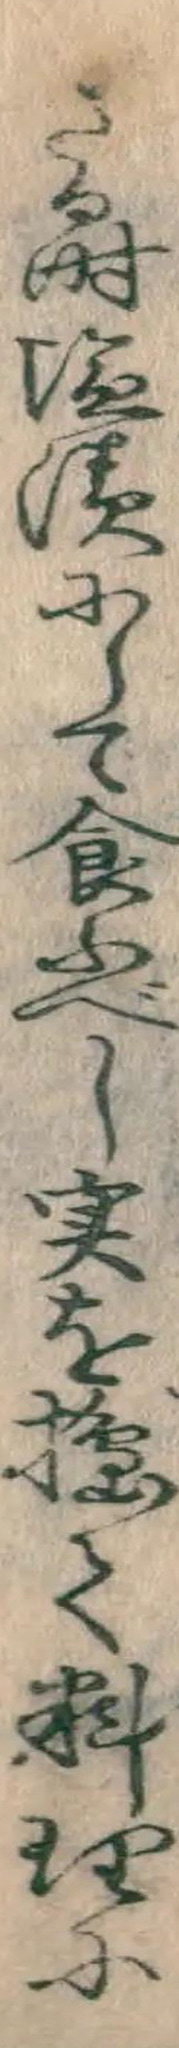たる時塩漬にして食ふべし実を搗て料理に
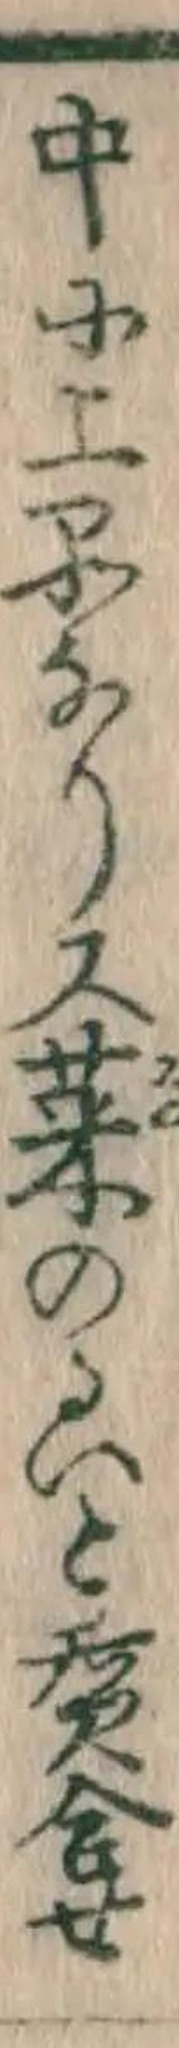中に上品なり又菜のるいと煮合せ
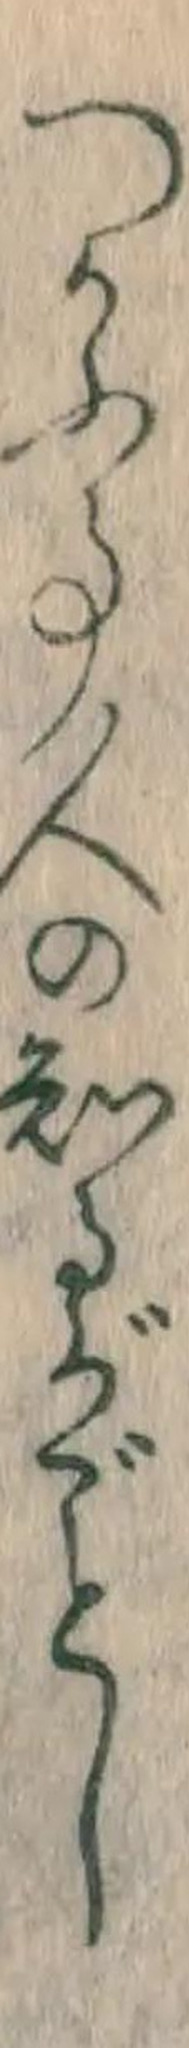つかふ事人の知るがごとし
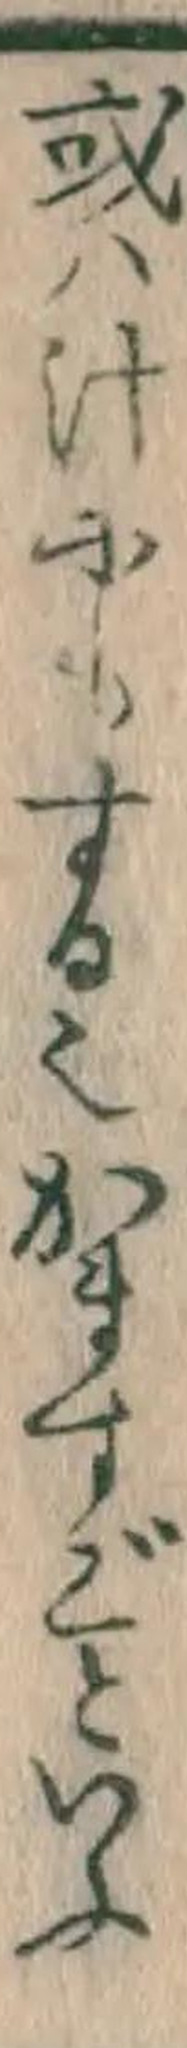或は汁にもする也かますごといふ
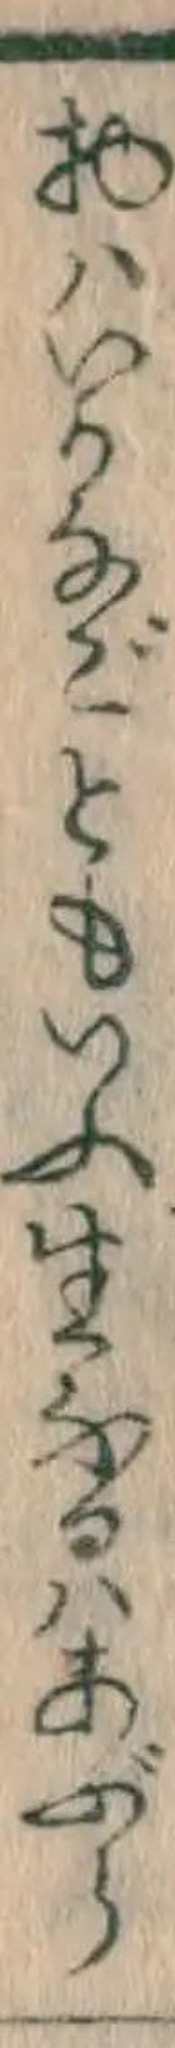物はいかなごともいふ生なるはあぶら
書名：広益秘事大全 3巻. [5]
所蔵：国立国会図書館 National Diet Library, JAPAN
